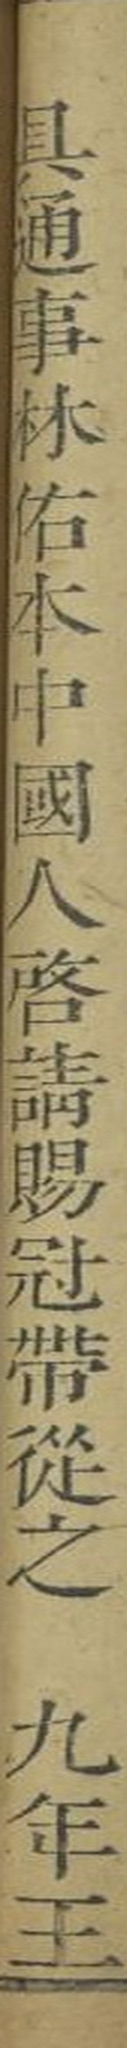具通事林佑本中国人啓請賜冠帯従之九年王
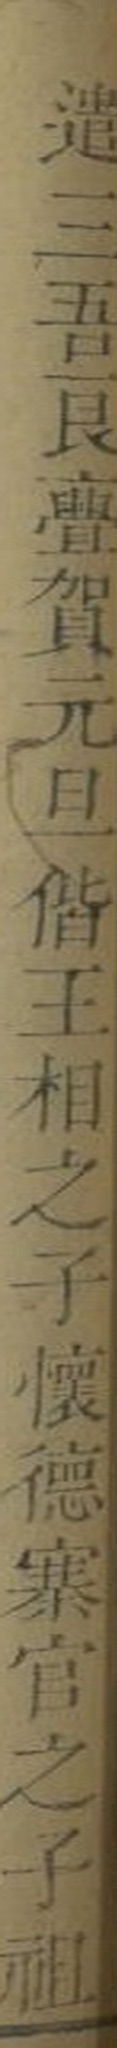遣三吾良亹賀元旦偕王相之子懐徳寨官之子祖
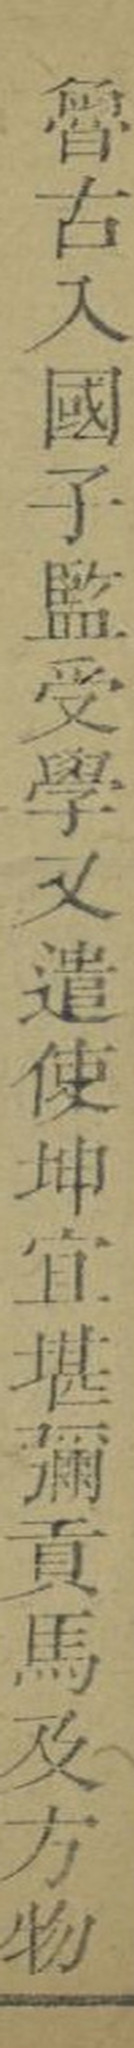魯古入国子監受学又遣使坤宜堪弥貢馬及方物
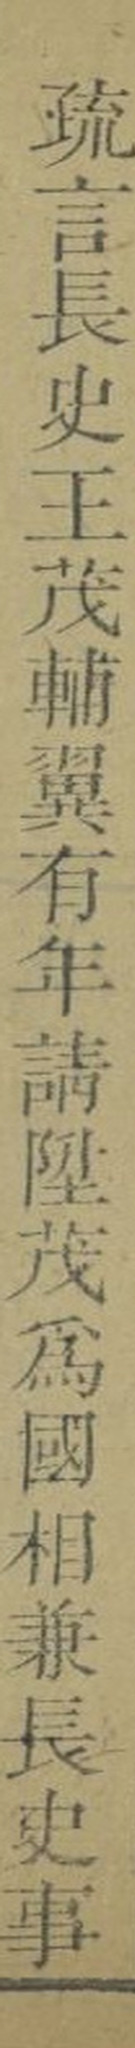疏言長史王茂輔翼有年請陞茂為国相兼長史事
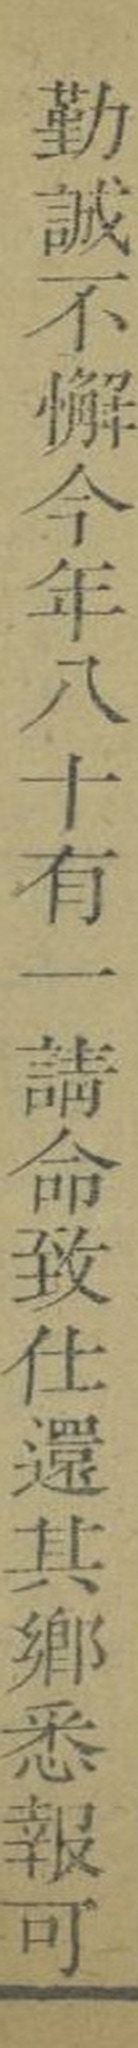勤誠不懈今年八十有一請命致仕還其郷悉報可
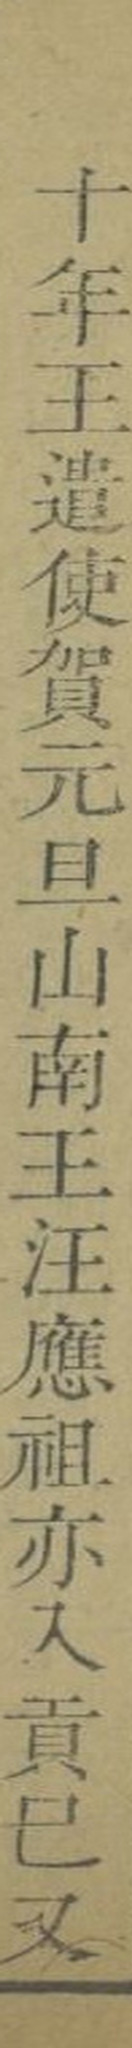十年王遣使賀元旦山南王汪応祖亦入貢巳又
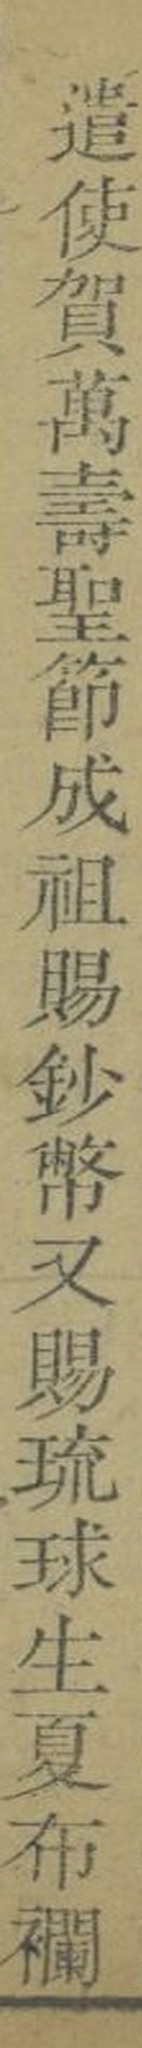遣使賀万寿聖節成祖賜鈔幣又賜琉球生夏布襴
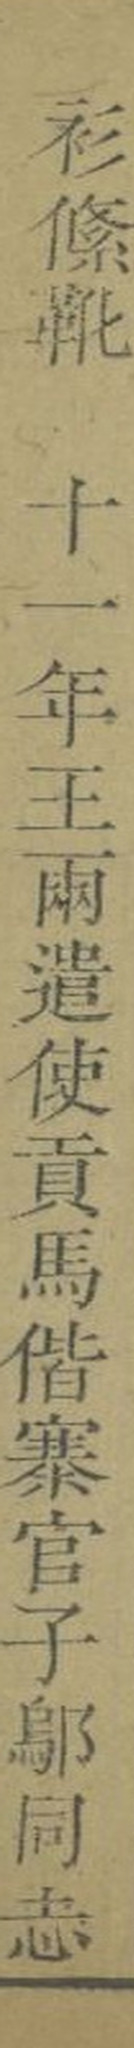衫絛靴十一年王両遣使貢馬偕寨官子鄔同志

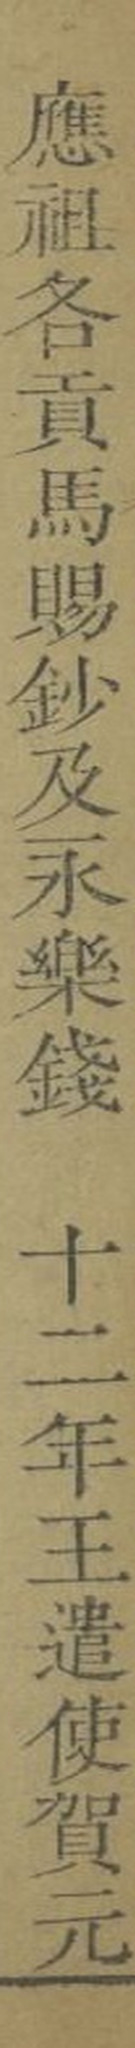応祖各貢馬賜鈔及永楽銭十二年王遣使賀元
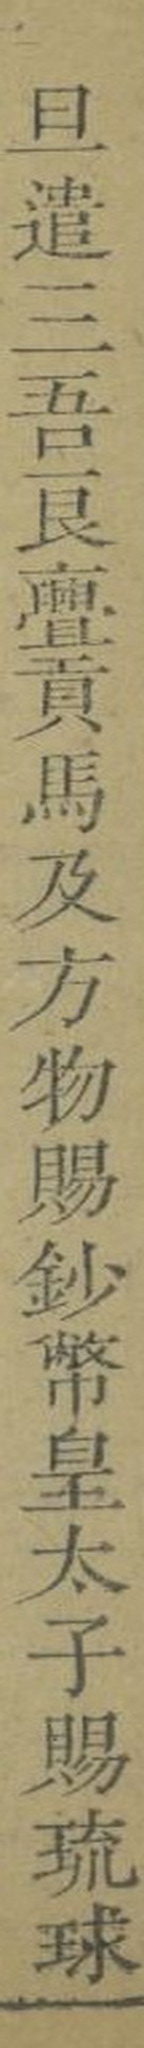旦遣三吾良亹貢馬及方物賜鈔幣皇太子賜琉球
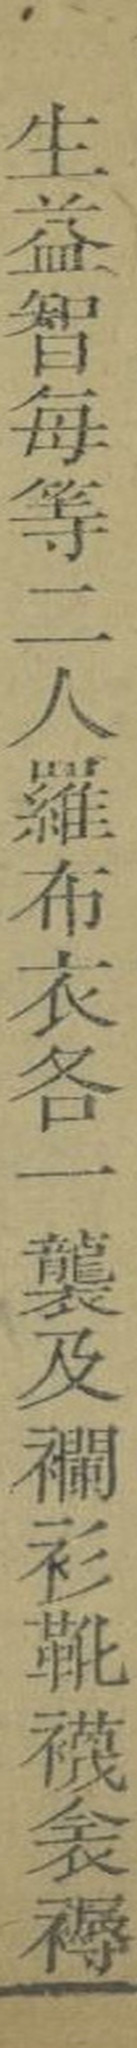生益智毎等二人羅布衣各一襲及襴衫靴襪衾褥
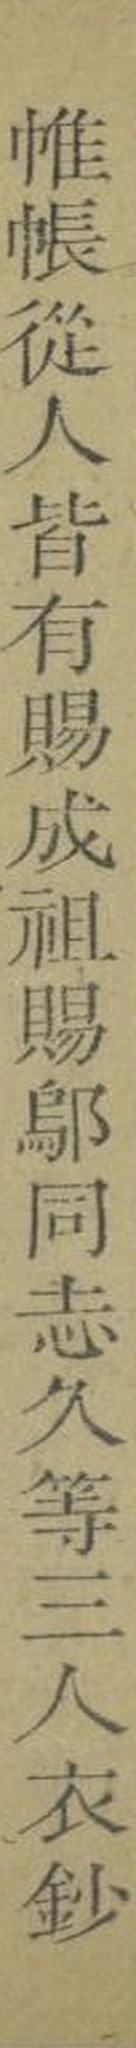帷帳従人皆有賜成祖賜鄔同志久等三人衣鈔
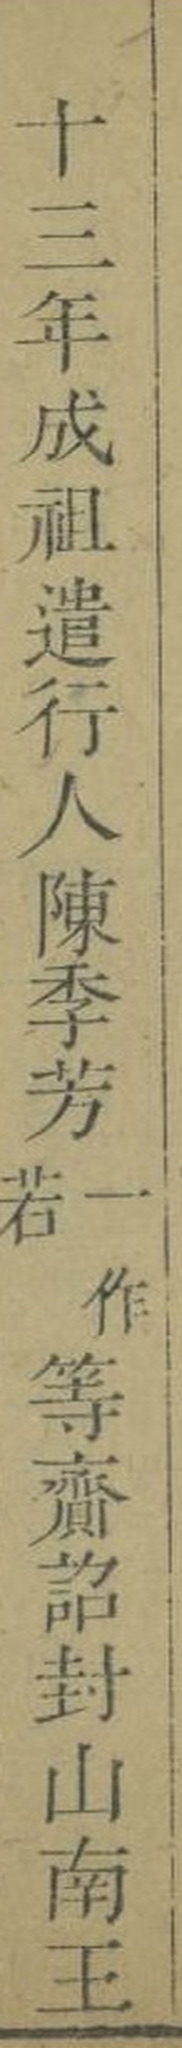十三年成祖遣行人陳季芳一作若等齎詔封山南王
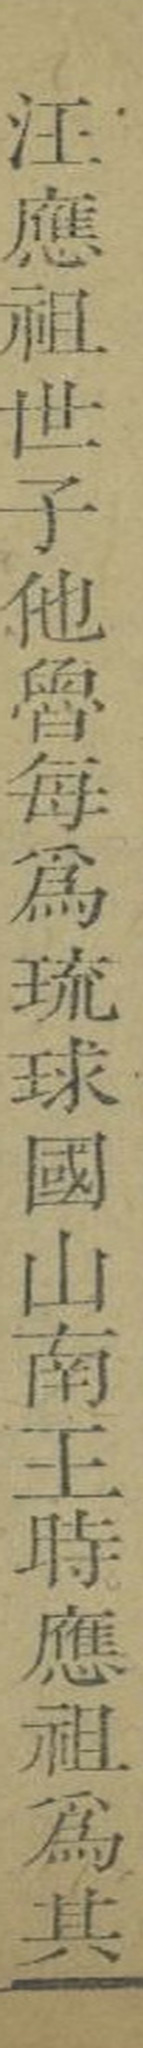汪応祖世子他魯毎為琉球国山南王時応祖為其
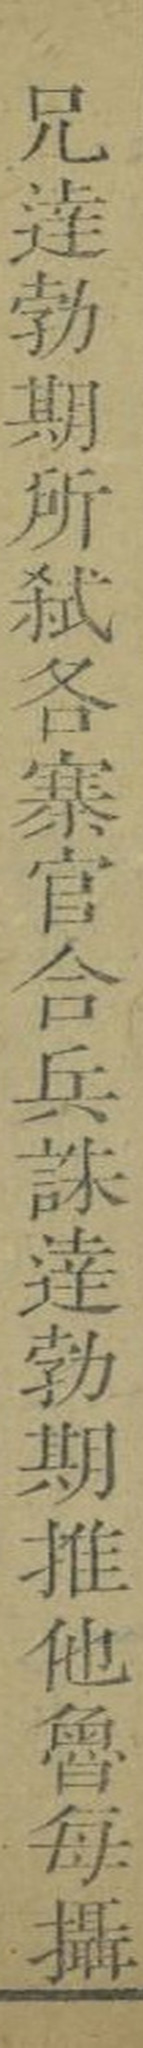兄達勃期所弑各寨官合兵誅達勃期推他魯毎摂
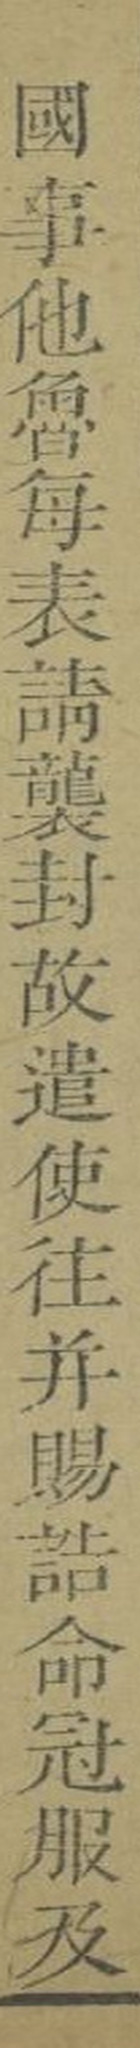国事他魯毎表請襲封故遣使往并賜誥命冠服及
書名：中山伝信録 巻三
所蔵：University of the Ryukyus Library
